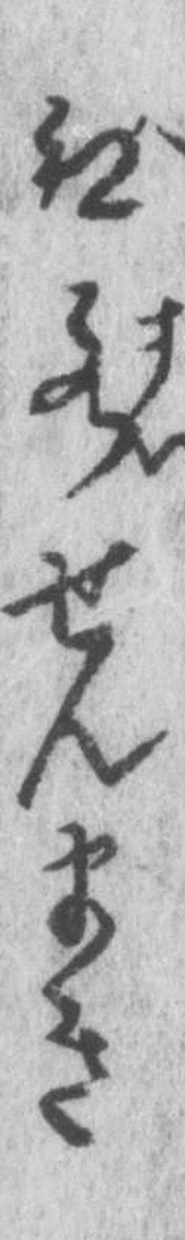紅水せんまき
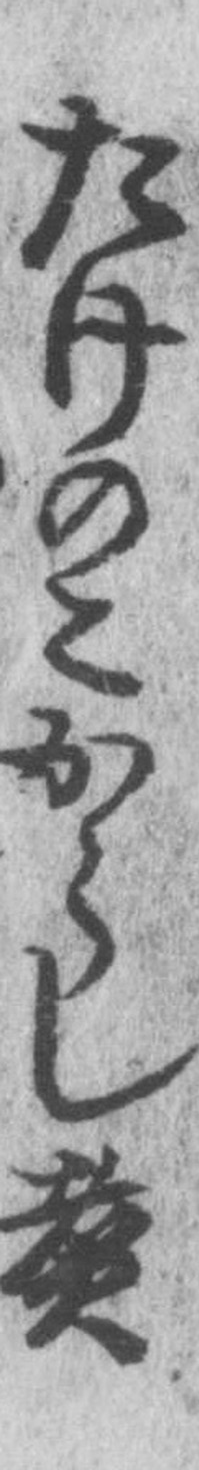たけのこ土佐煮

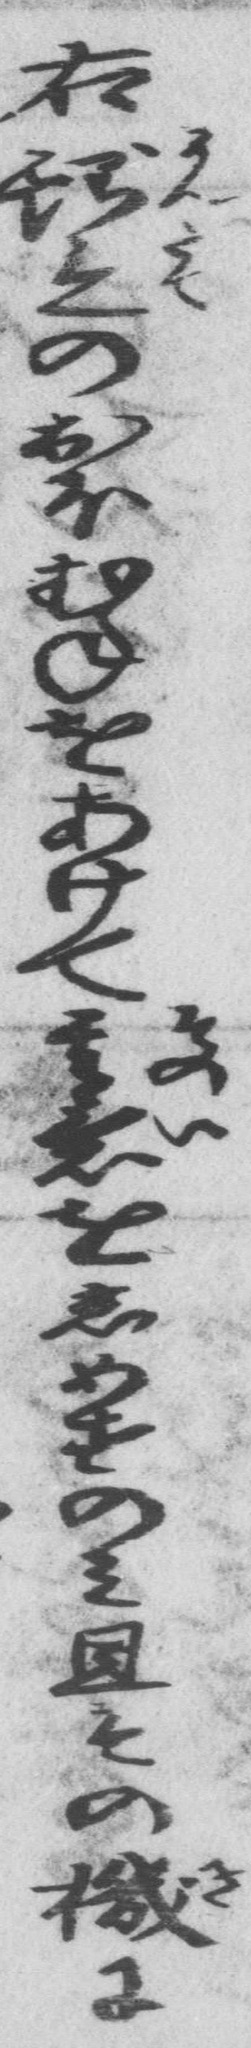右献立のおほむねをあけて其意をしめすのミ且その機に
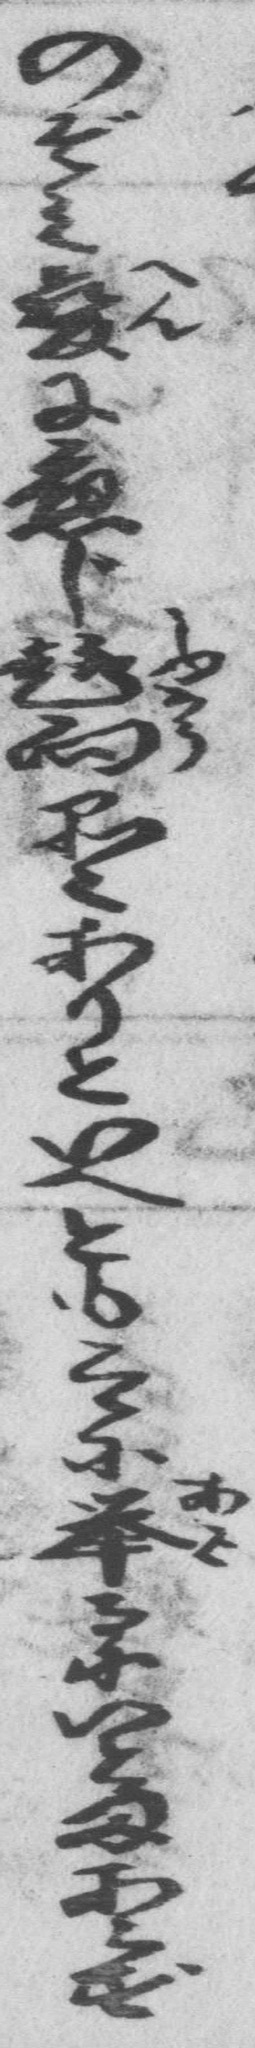のぞミ変に應じ趣向ありと火ともそね挙るにいとまあらず
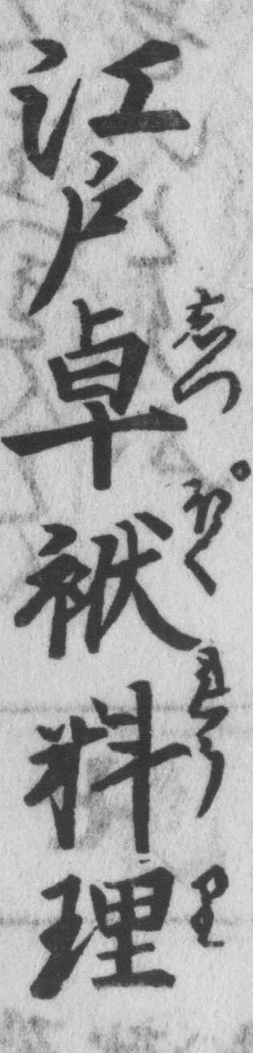江戸卓袱料理
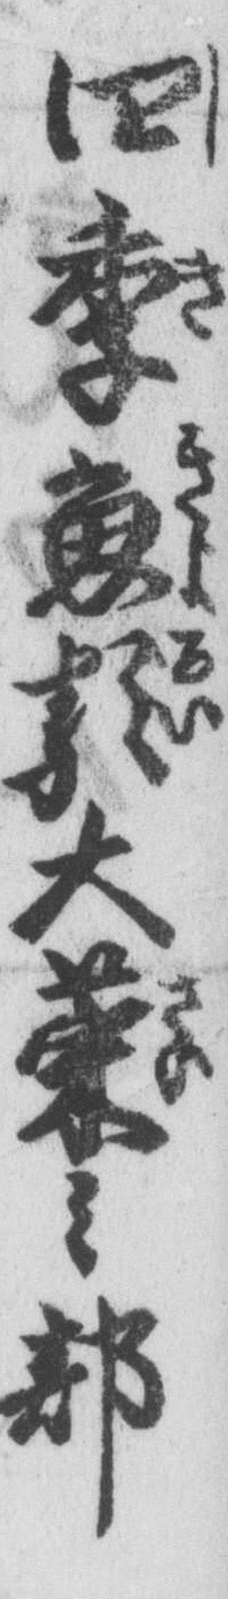四季魚類大之部

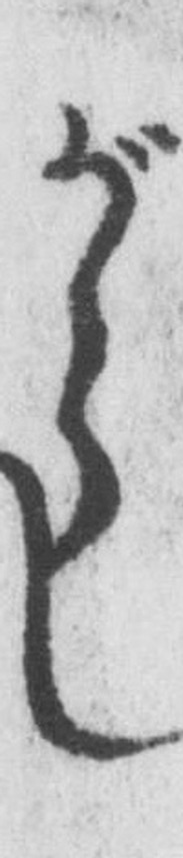がらし
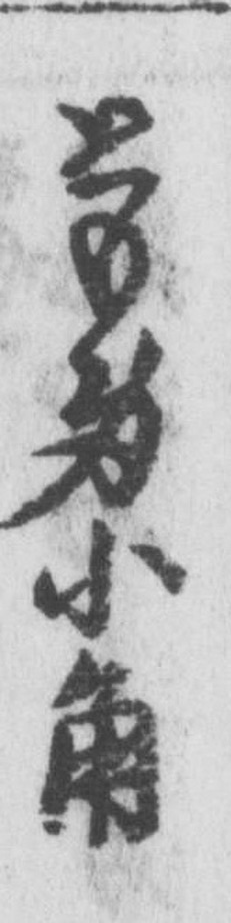甘煮身小角
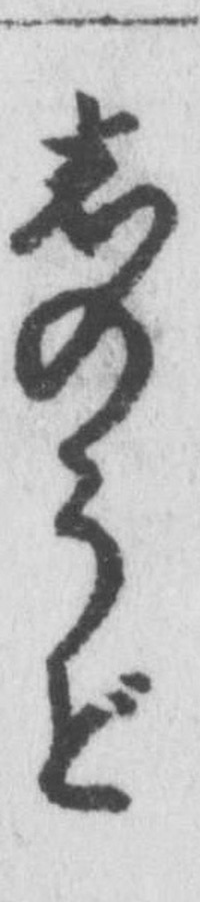しのうど
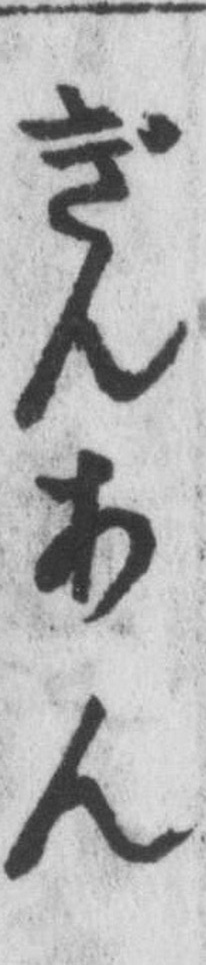ぎんあん
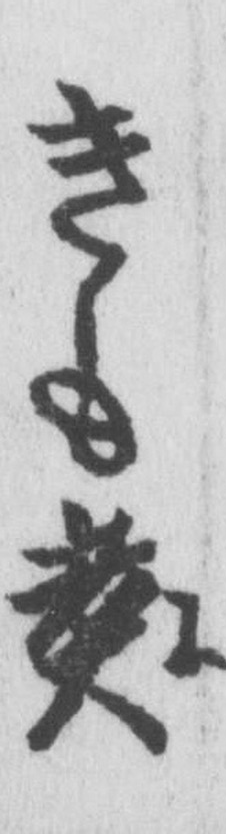きも煮
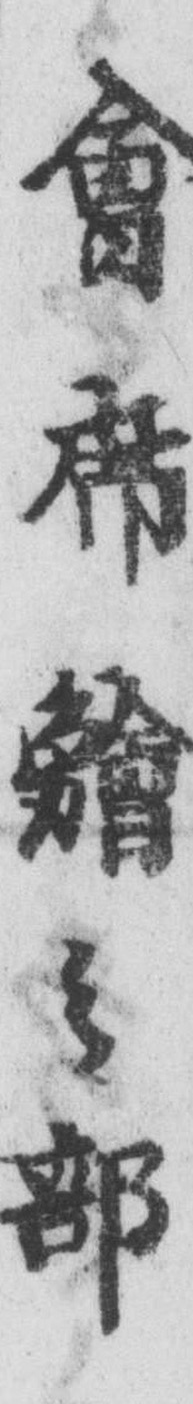會席鱠之部
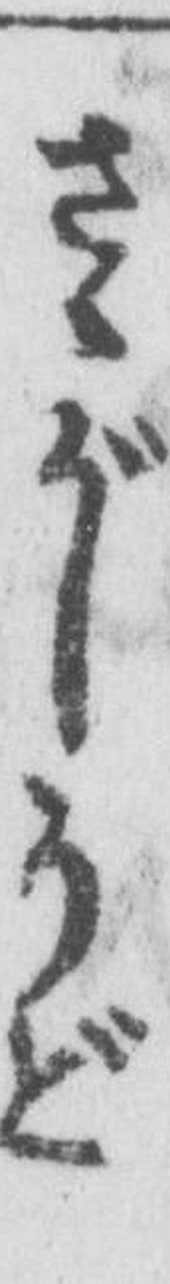さゝがしうど
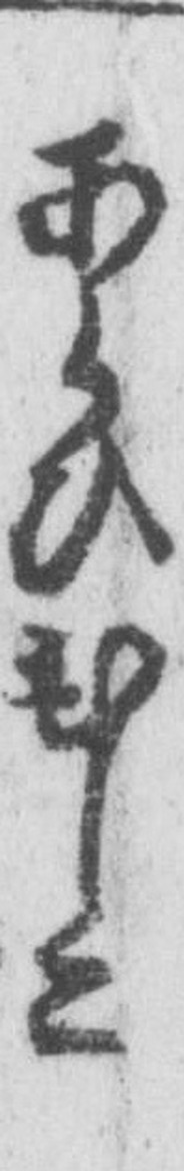あらひひしこ
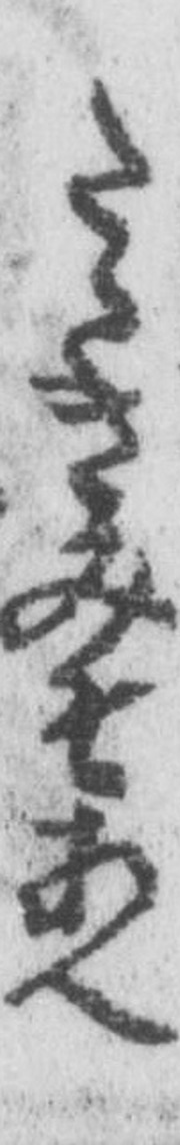たたきみそあへ
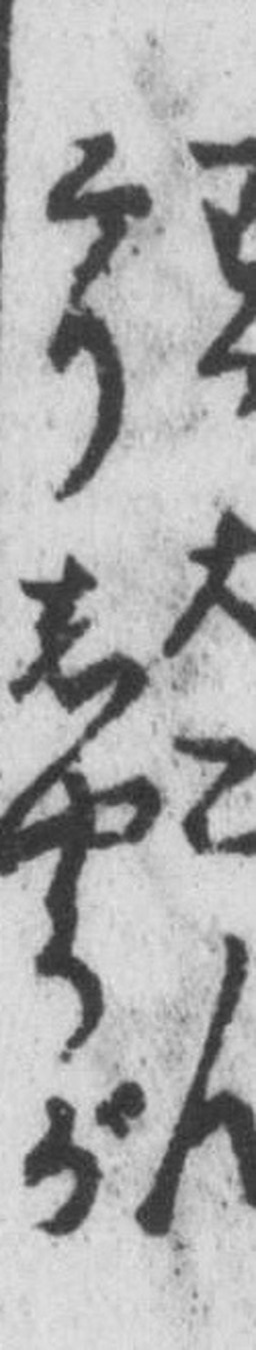ふくめしやうが
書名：当世料理献立
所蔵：大阪府立大学学術情報センター 国文学研究資料館
